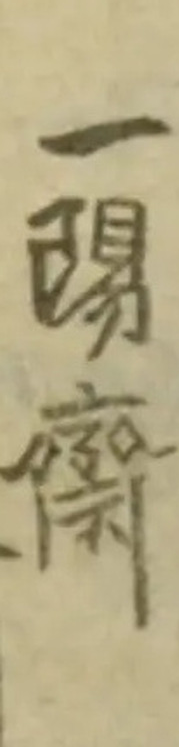一陽斎
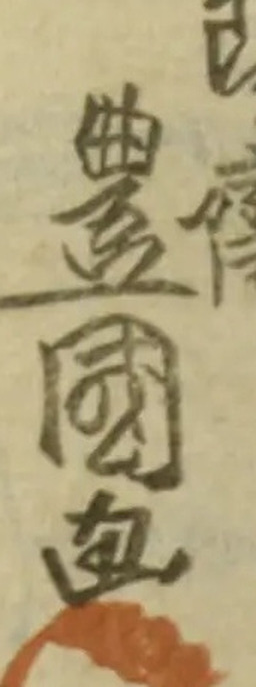豊国画
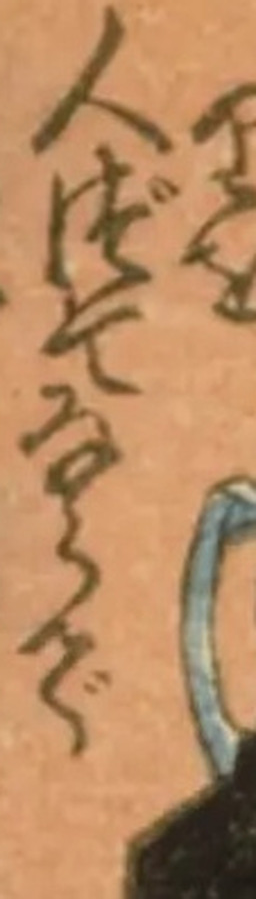人づてならで
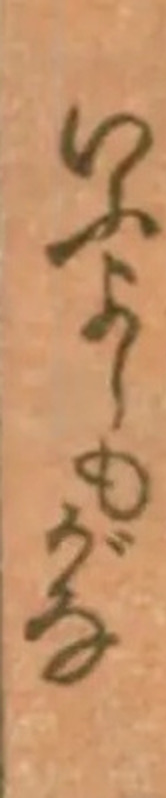いふよしもがな
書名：六十三番　左京太夫道雅
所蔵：国立国会図書館 National Diet Library, JAPAN
